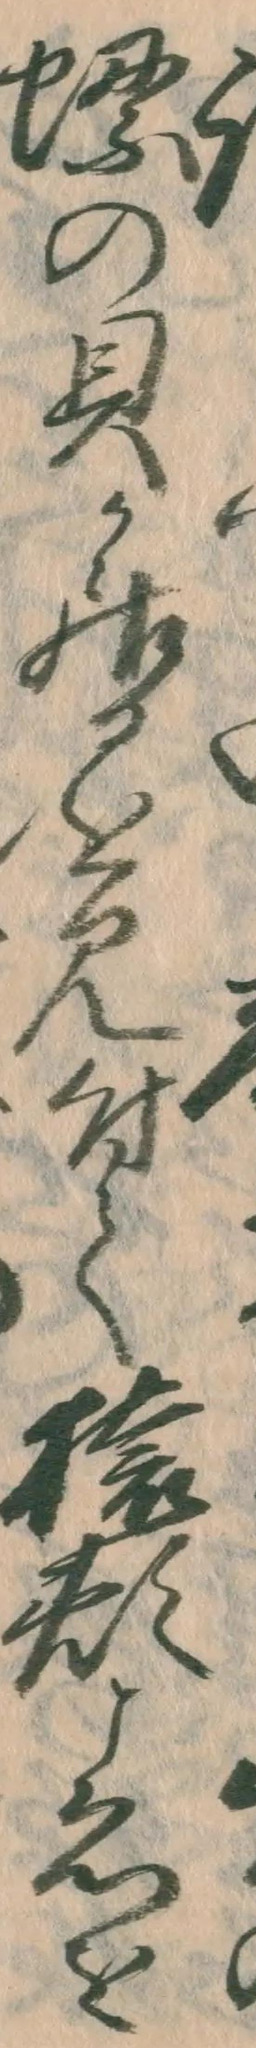螺の貝か居るを見付て猿頬こえを
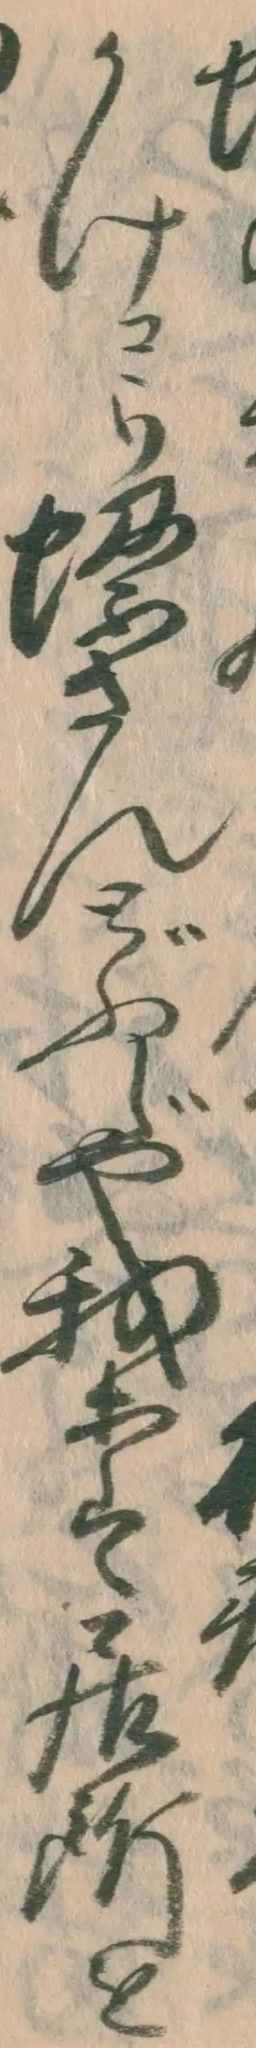かけコヽワ螺さんどふじや我等は居所を
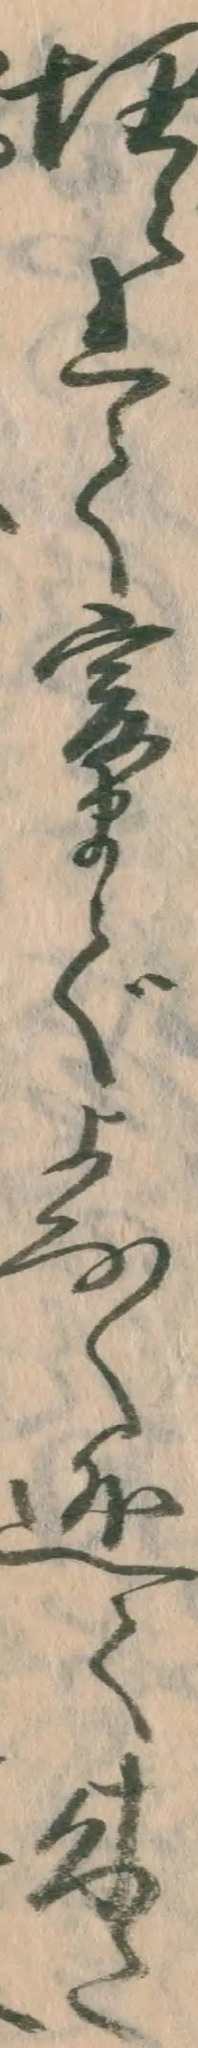埋られて爰までよろ〳〵迯て来た
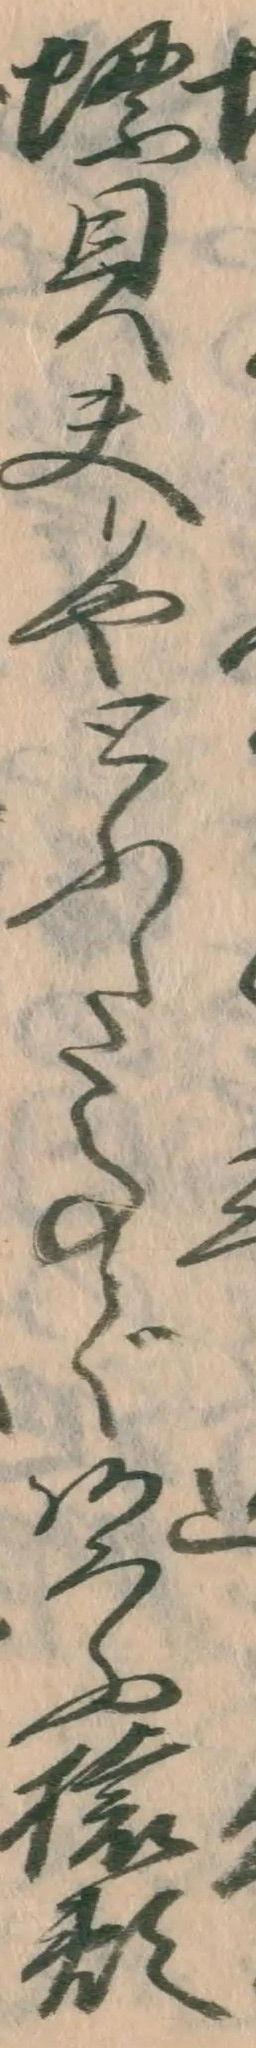螺貝夫りやとふした事であろふ猿頬
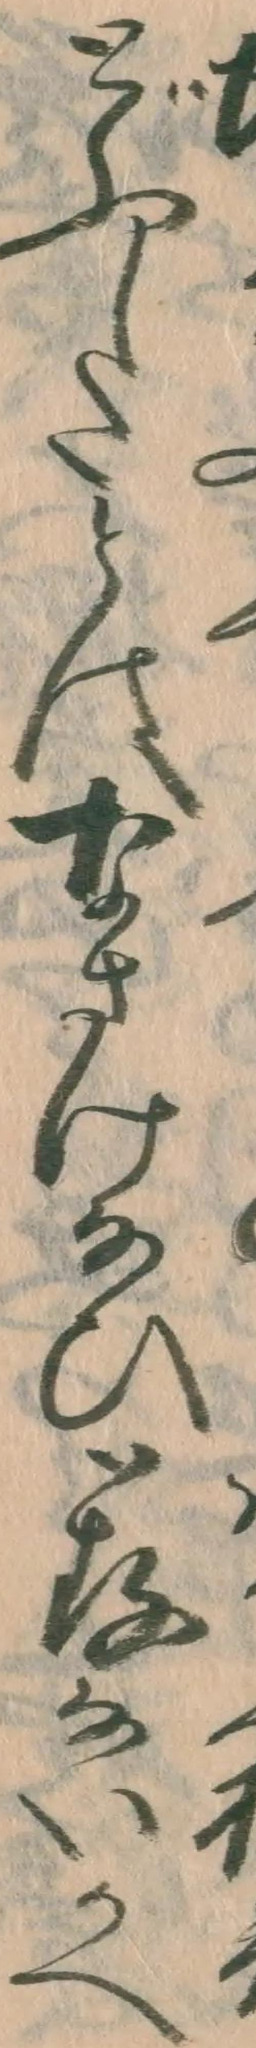どふしたとはなさけなひ御存ないかへ
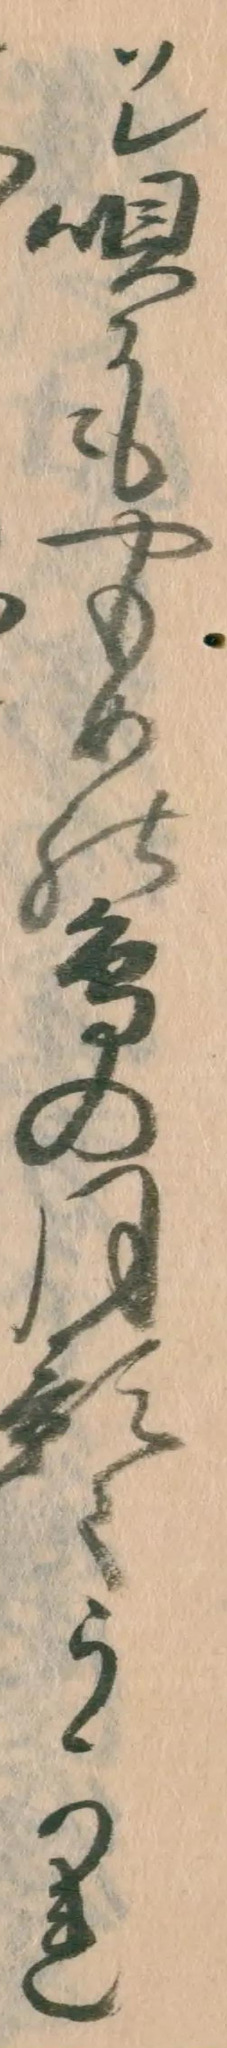ソレ唄にもやもめの烏の月影にうかれ
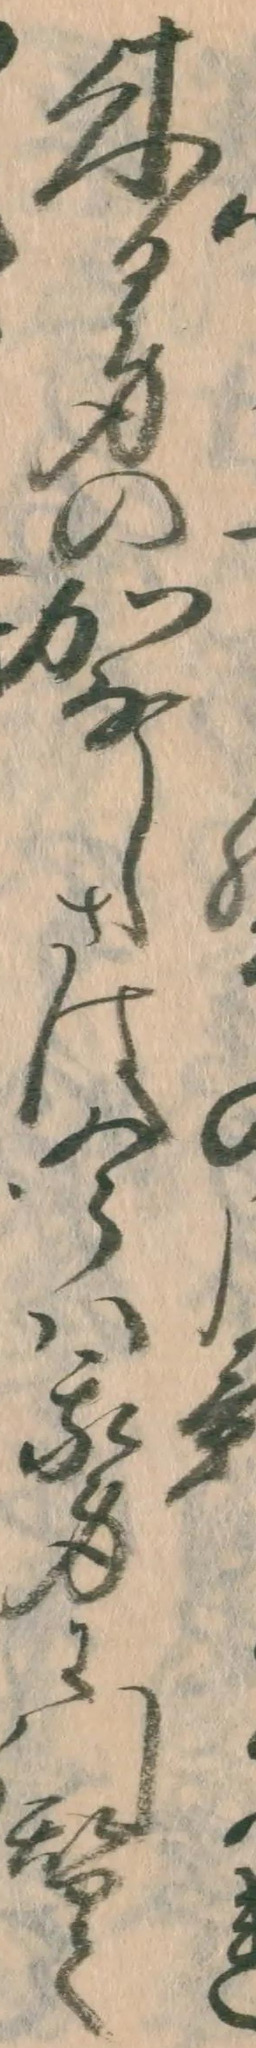来る身のかなしさは今ハ我身に引替て
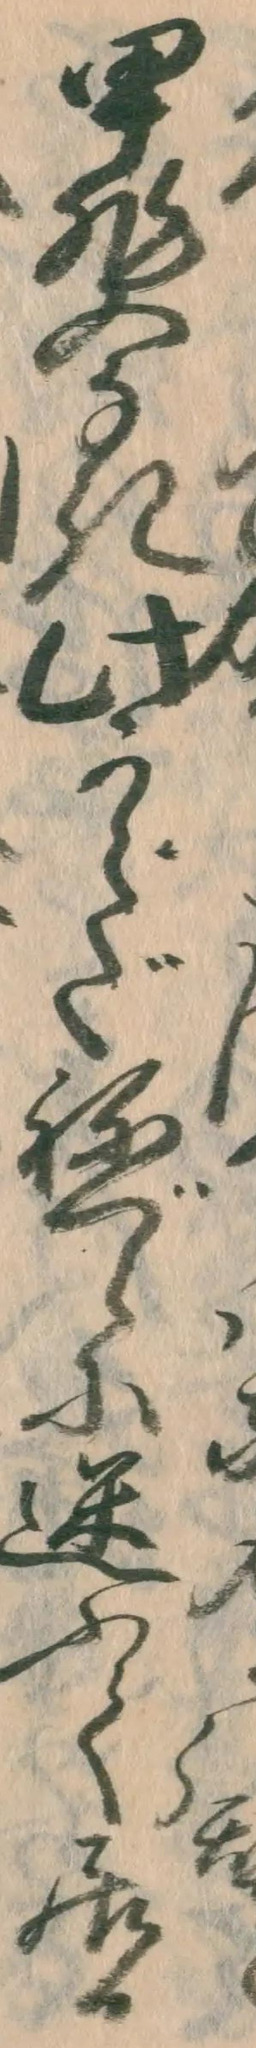甲斐なき此からだねぐらに迷ふて居る
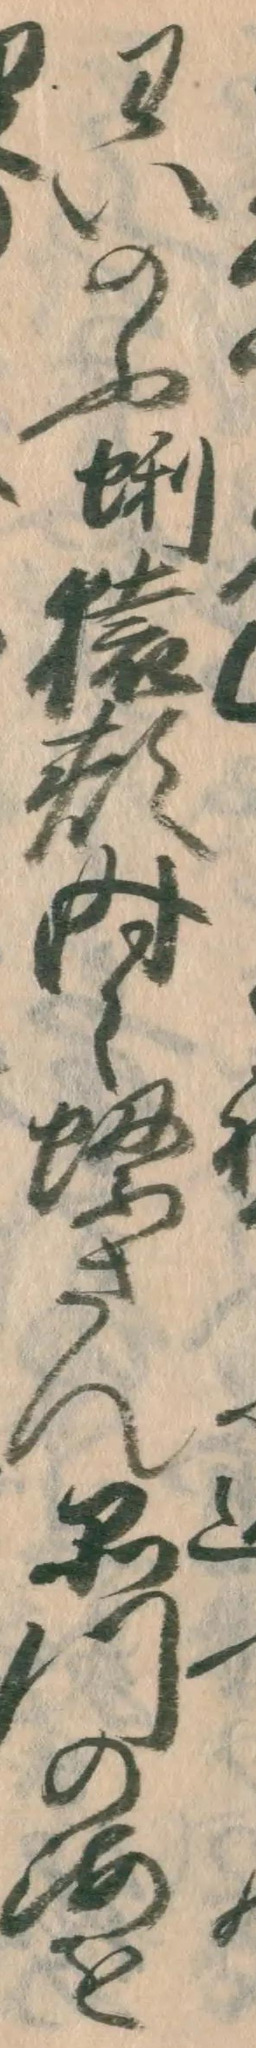わいのふ蜊猿頬時に螺さん品川の海を
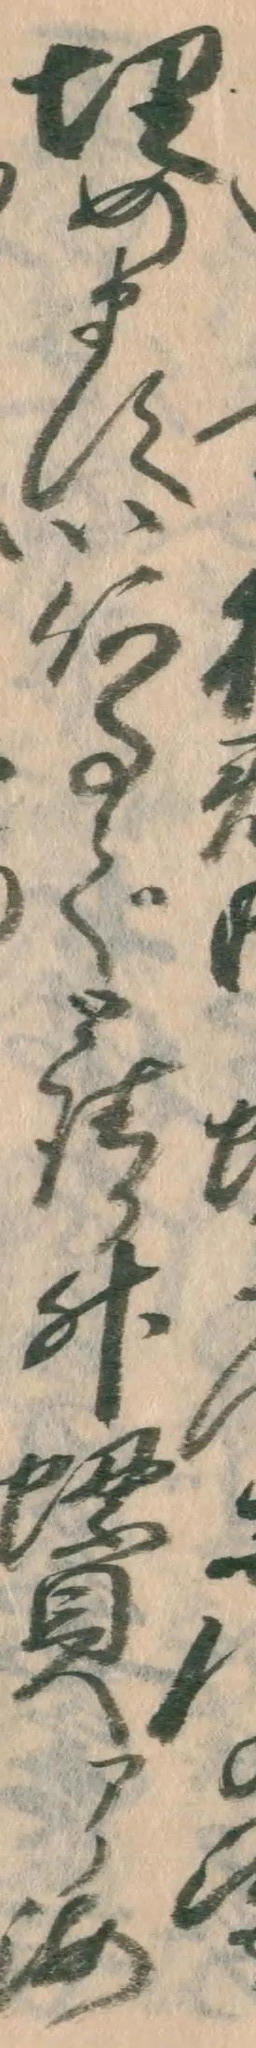埋めますハ何事で御座り升螺貝アノ海
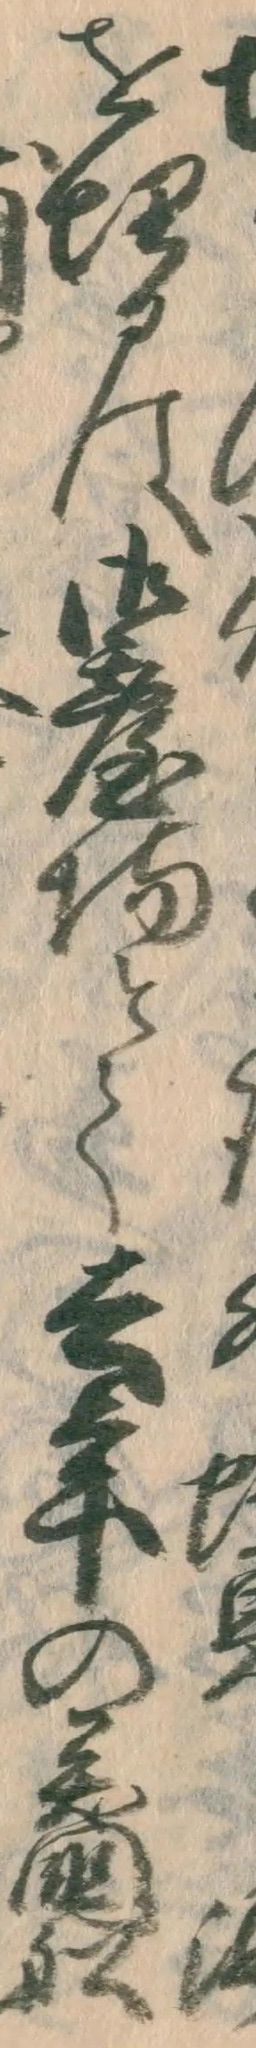を埋るは御臺場とて去年の異国船
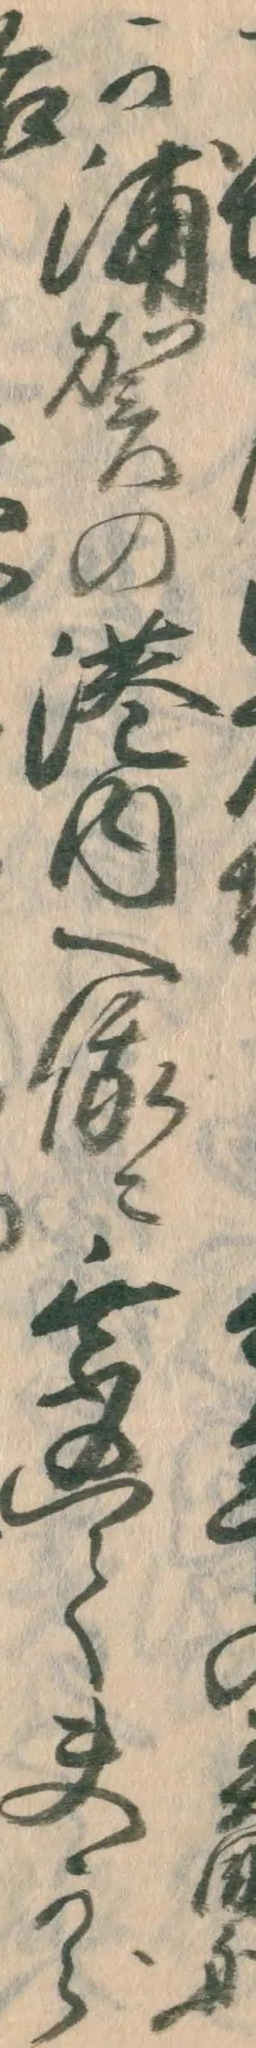か浦賀の港内へ俄ニ乗込て夫から
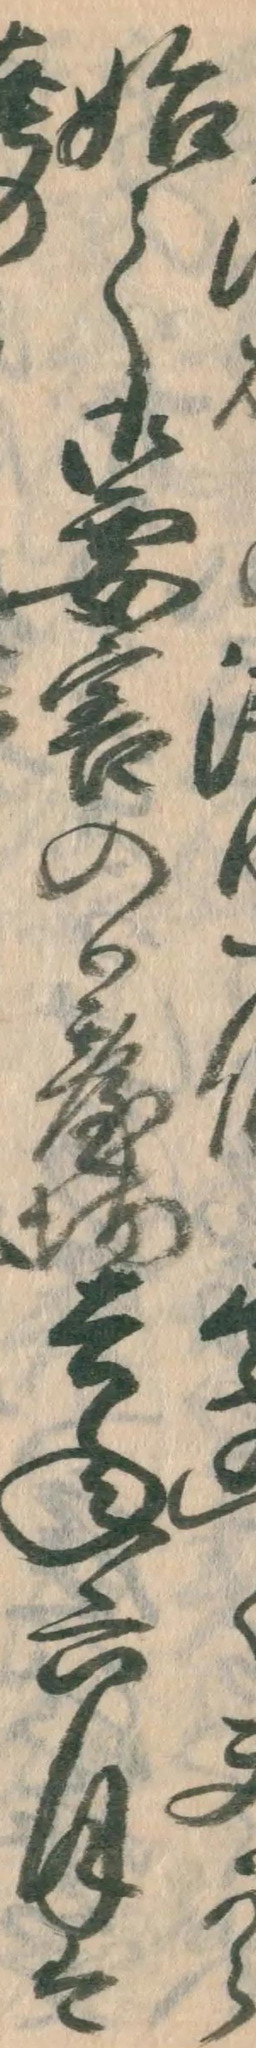始て御要害の御臺場去年六月は
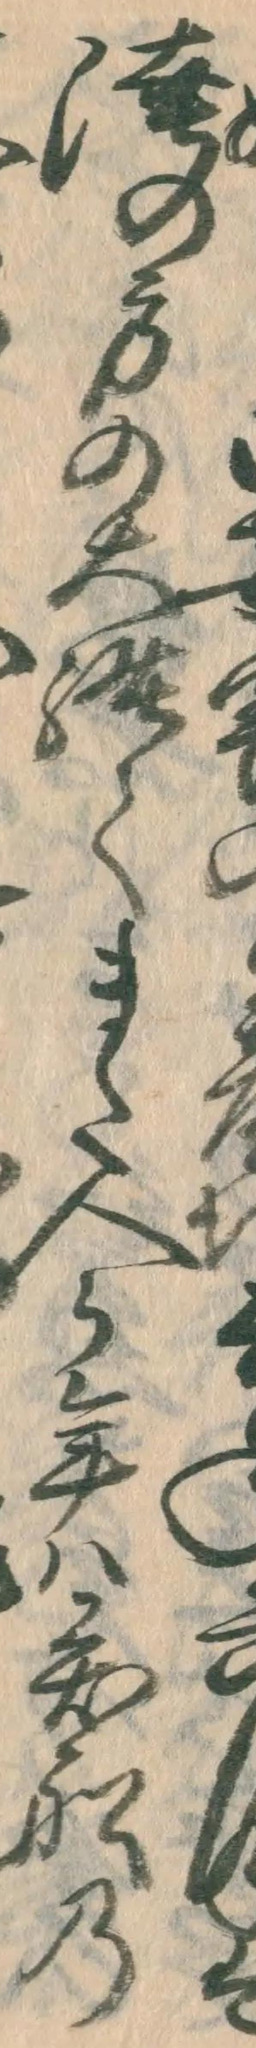陸の方の大騒てまた今年ハ異船の
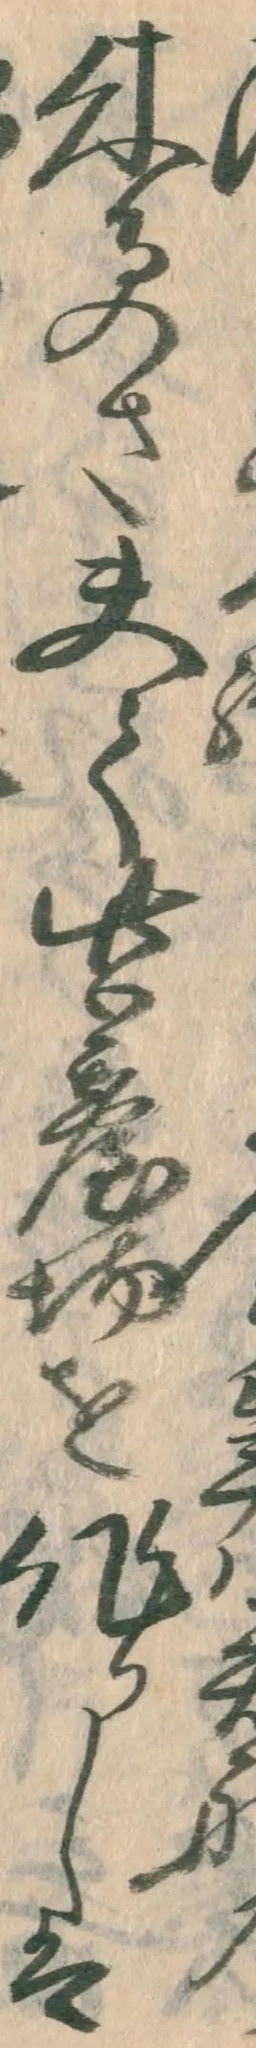来るのさ夫て此御臺場を作りしは
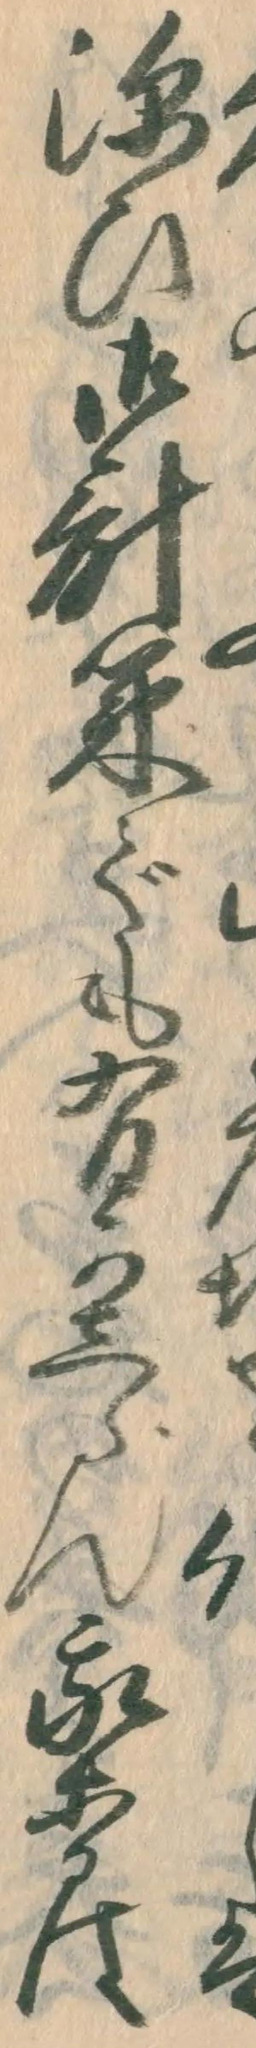深ひ御計策でも有かしらん我等には
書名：麗斎叢書. 20
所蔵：国立国会図書館 National Diet Library, JAPAN
